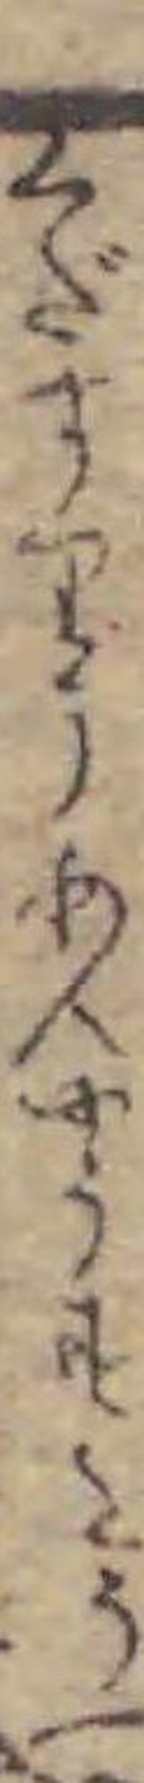くだすりうあんやうすをう
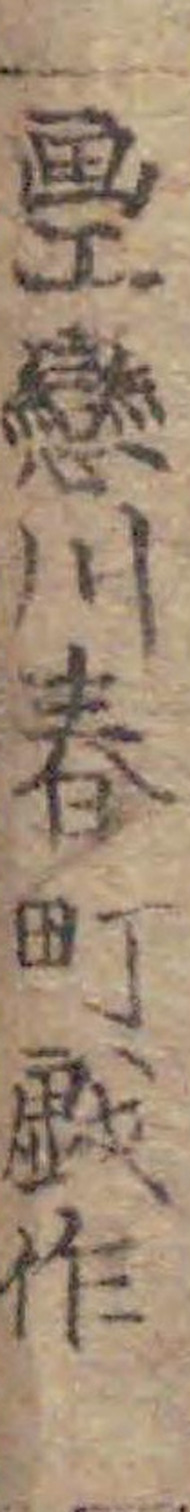画工恋川春町戯作
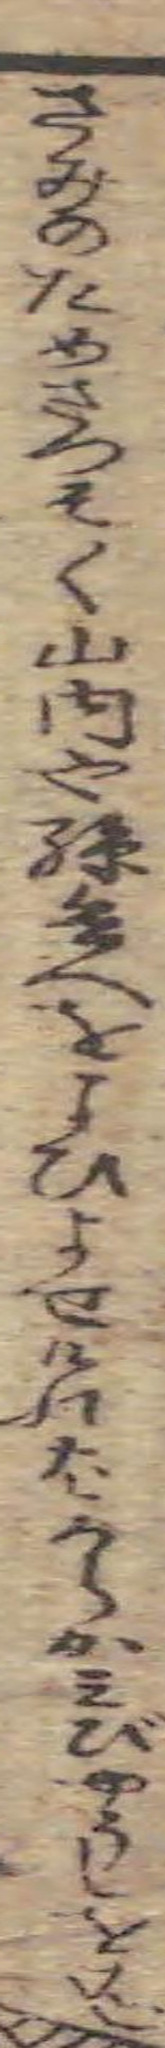さみのためさつそく山内や孫兵へをよひよせければからかみびやうしをはじ
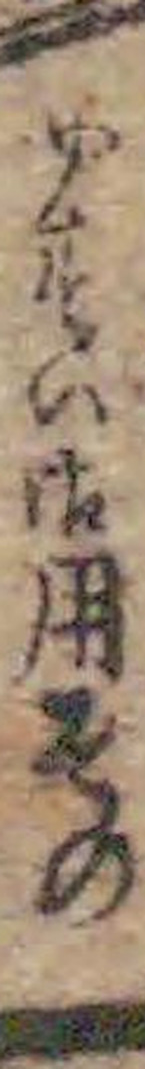やすい御用その
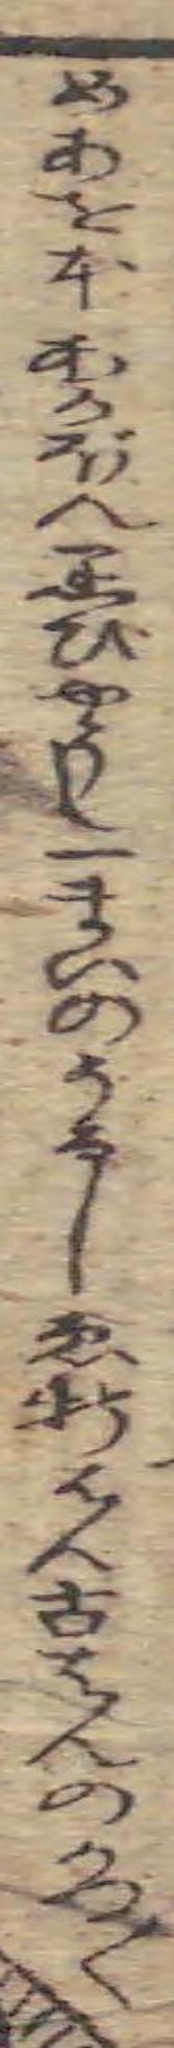めあを本あかぼん黒びやうし一まいのうるしゑ新はん古はんのかつ〳〵
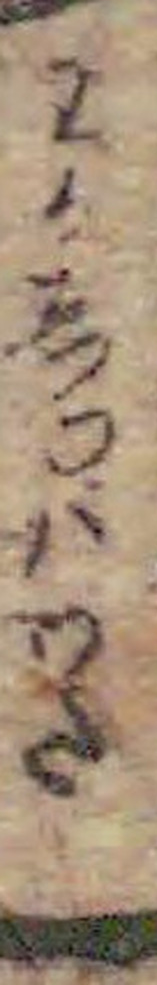わかしゆはわた
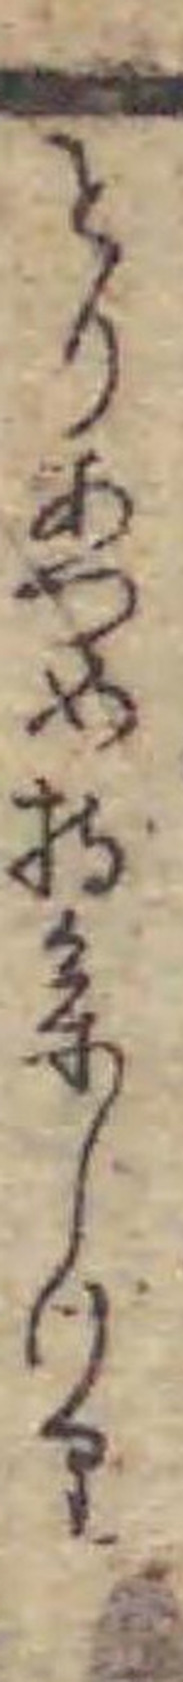をとりあつめ持参しけり
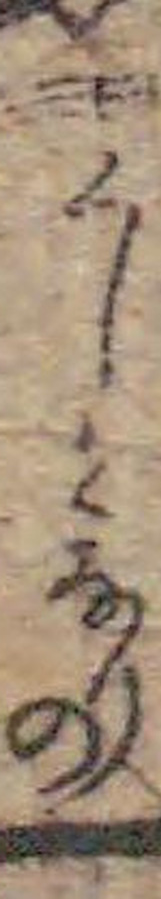くしとなりの
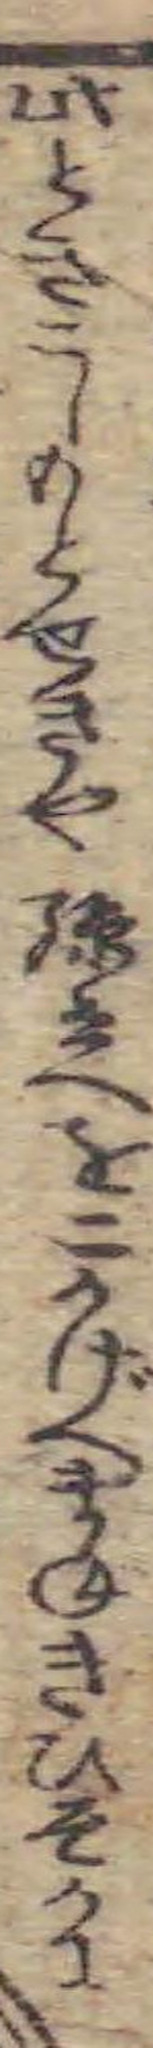此ときこしもとせきや孫兵へをこかげへまねきひそかに
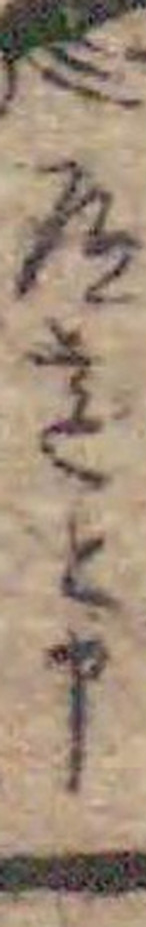道意と申
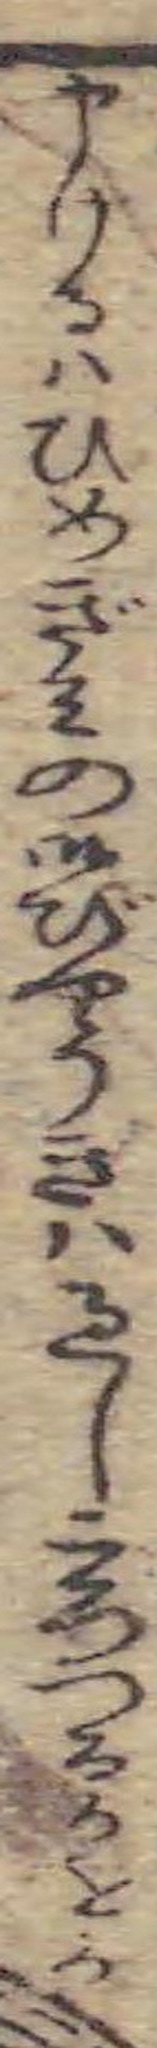申けるはひめぎみの御びやうきは過しころつるかをか
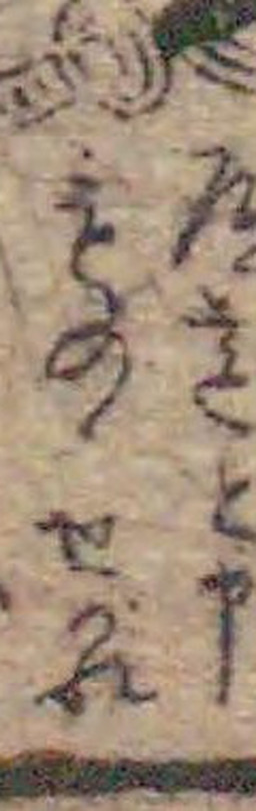ものゝせがれ
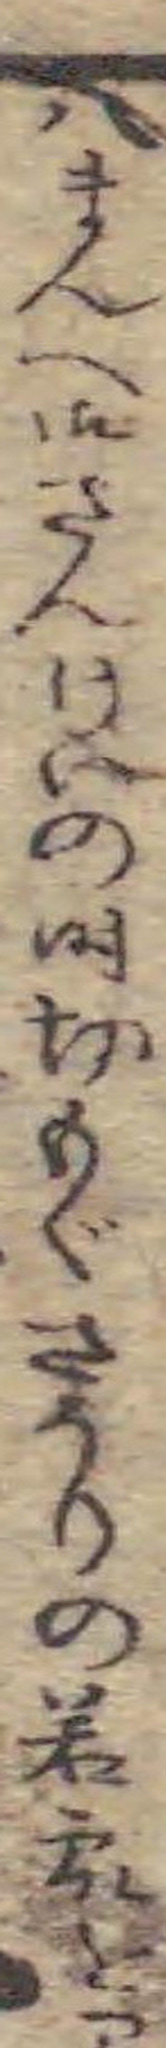八まんへ御さんけいの時切もぐさうりの若衆を見
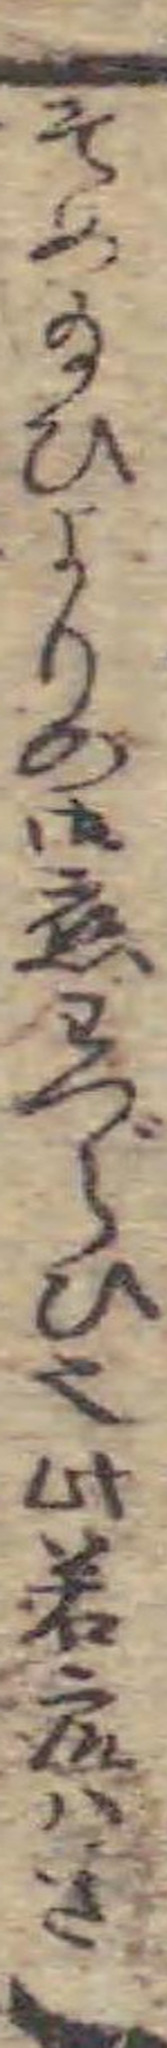そめ給ひよりの御恋わづらひ也此若衆はさ
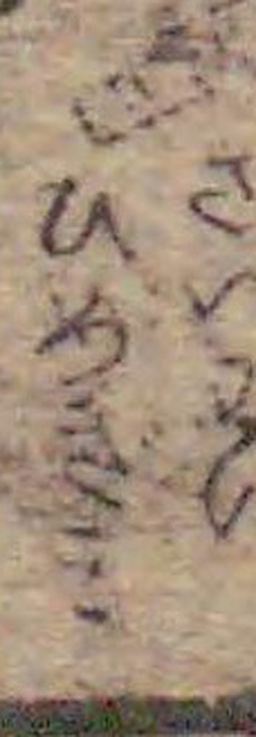ひめぎみ
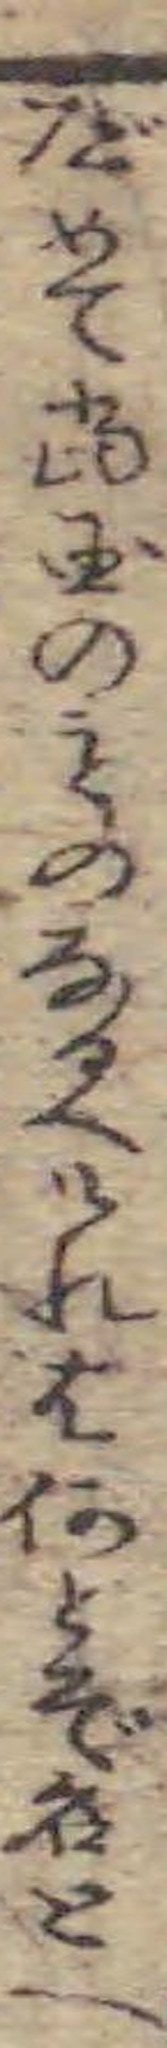だめて当国のものなるへけれは何とぞ名と
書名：三舛増鱗組 : 3巻
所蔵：国立国会図書館 National Diet Library, JAPAN
